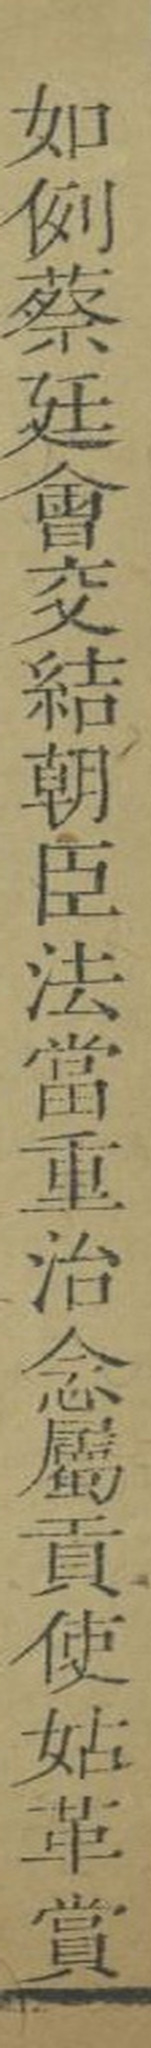如例蔡廷会交結朝臣法当重治念属貢使姑革賞
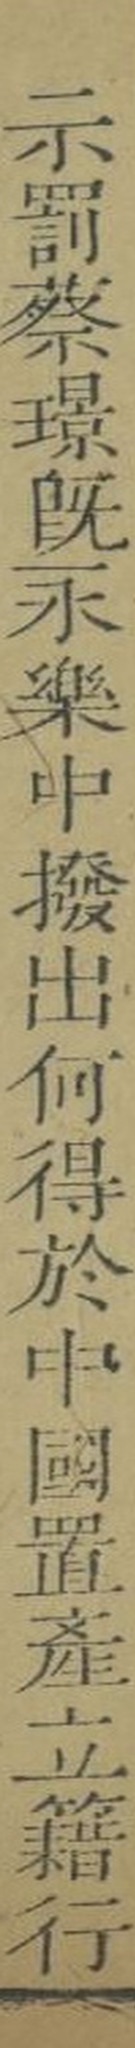示罰蔡璟既永楽中撥出何得於中国置産立籍行
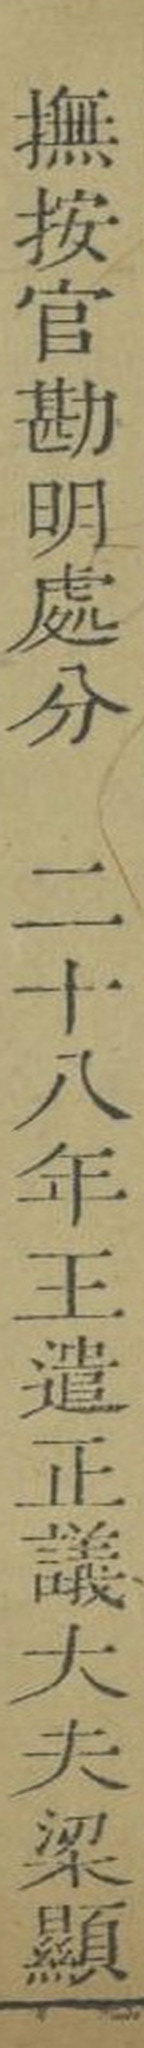撫按官勘明処分二十八年王遣正議大夫梁顕
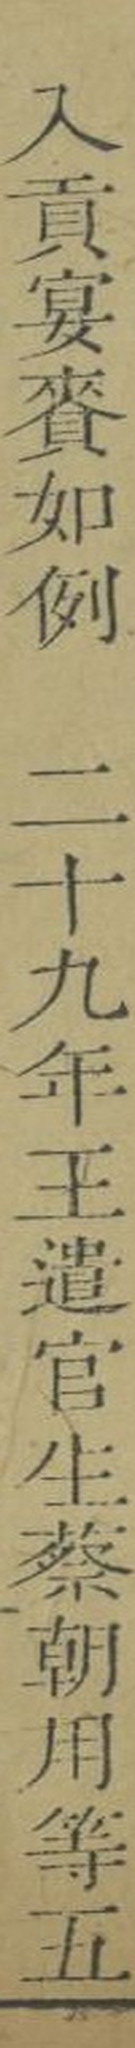入貢宴賚如例二十九年王遣官生蔡朝用等五
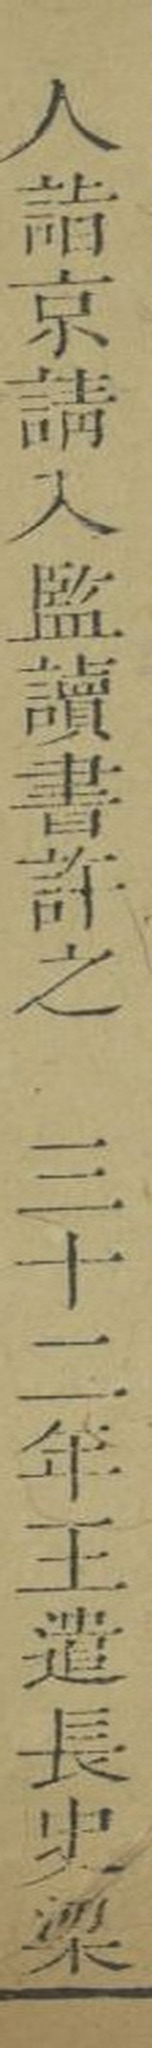人詣京請入監読書許之三十二年王遣長史梁
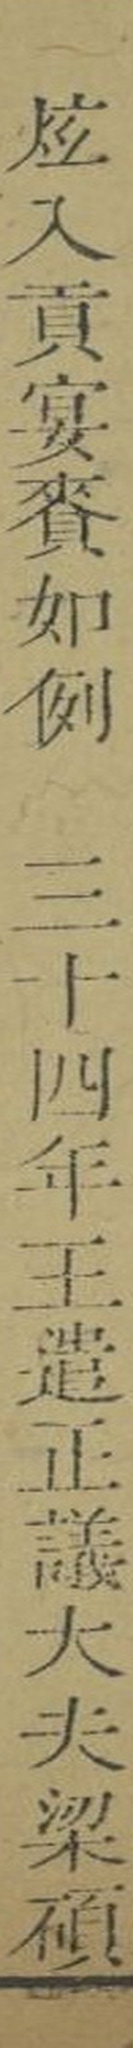炫入貢宴賚如例三十四年王遣正議大夫梁碩
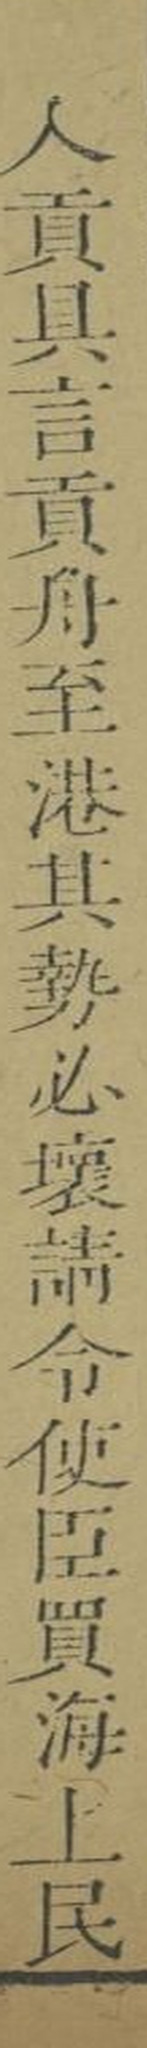入貢具言貢舟至港其勢必壊請令使臣買海上民
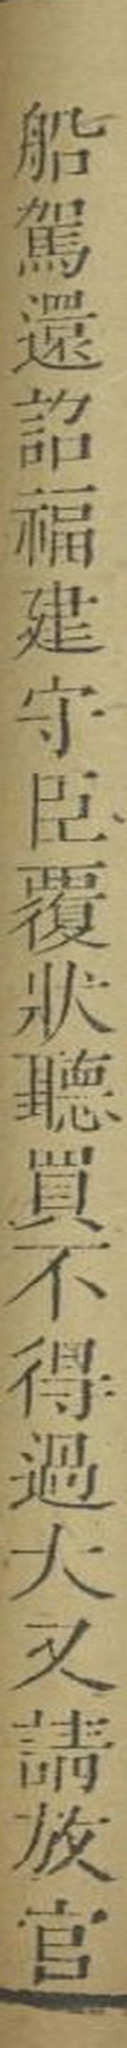船駕還詔福建守臣覆状聴買不得過大又請放官
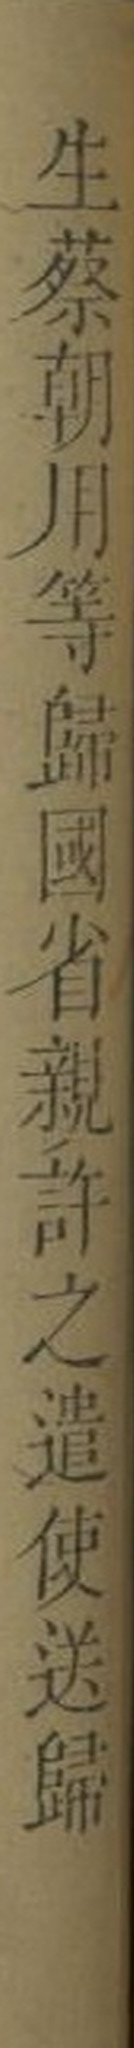生蔡朝用等帰国省親許之遣使送帰
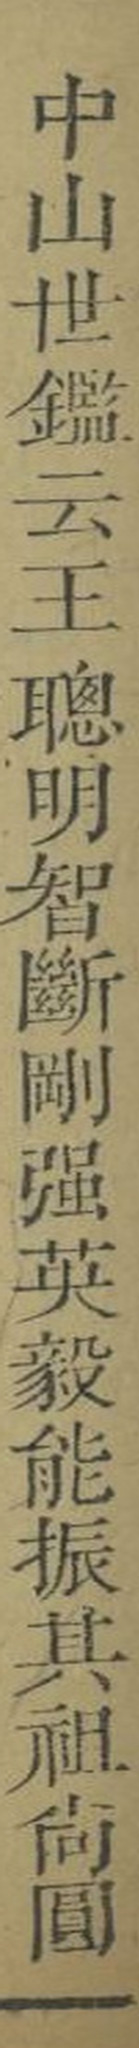中山世鑑云王聡明智断剛強英毅能振其祖尚円
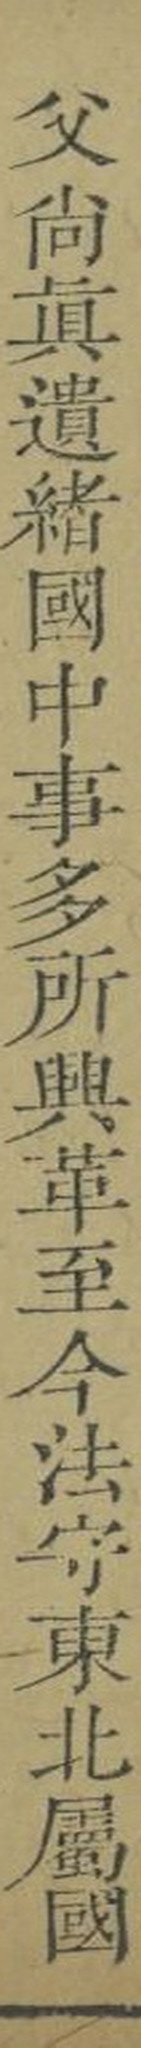父尚真遺緒国中事多所興革至今法守東北属国
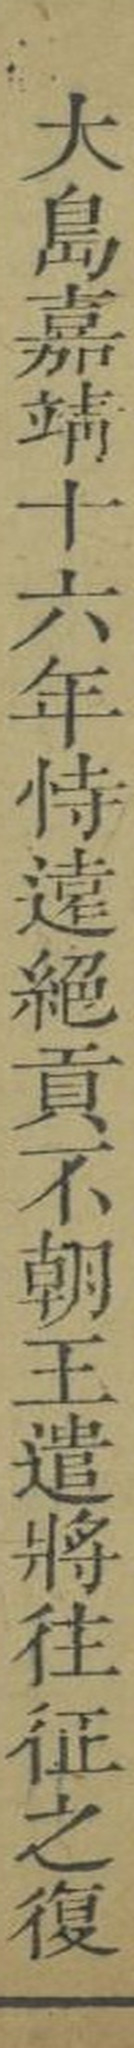大島嘉靖十六年恃遠絶貢不朝王遣将往征之復
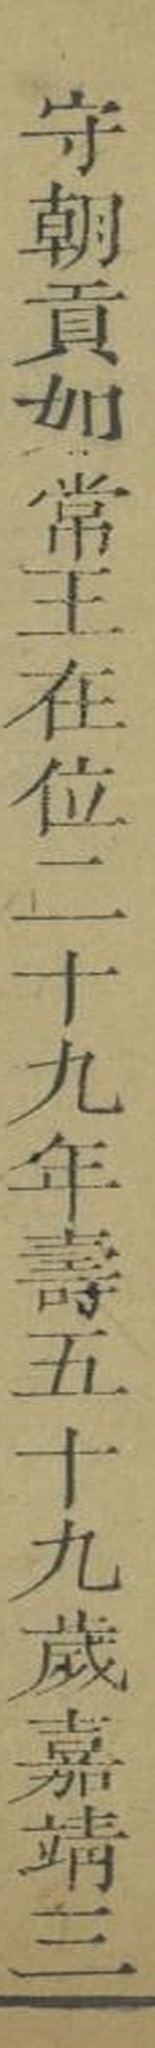守朝貢如常王在位二十九年寿五十九歳嘉靖三
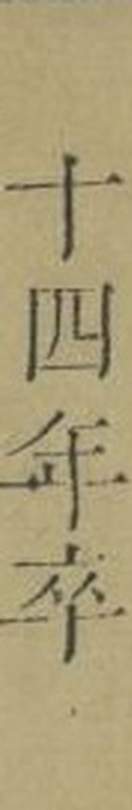十四年卒
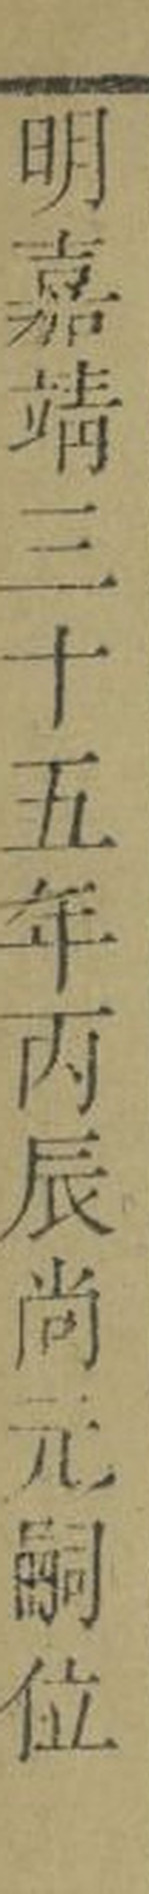明嘉靖三十五年丙辰尚元嗣位
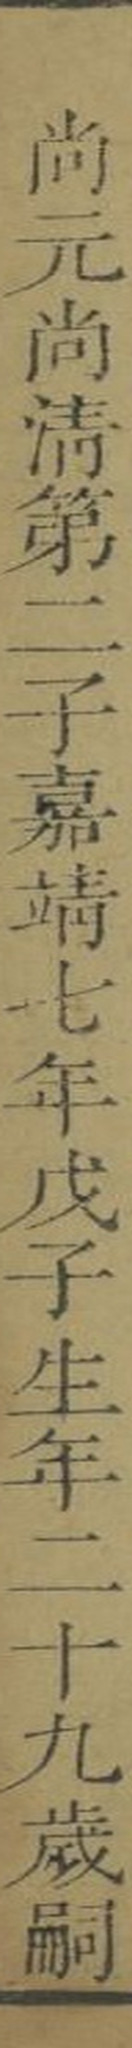尚元尚清第二子嘉靖七年戌子生年二十九歳嗣
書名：中山伝信録 巻三
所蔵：University of the Ryukyus Library
